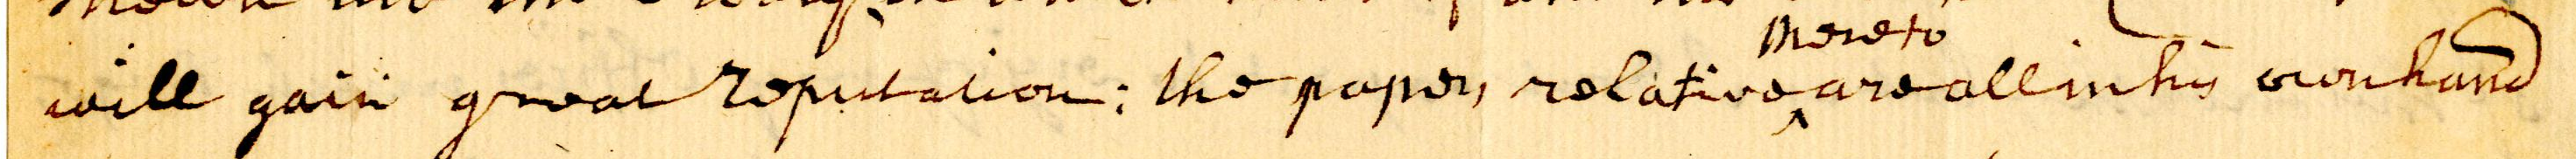will gain great reputation: the papers relative ^ are all in his own hand
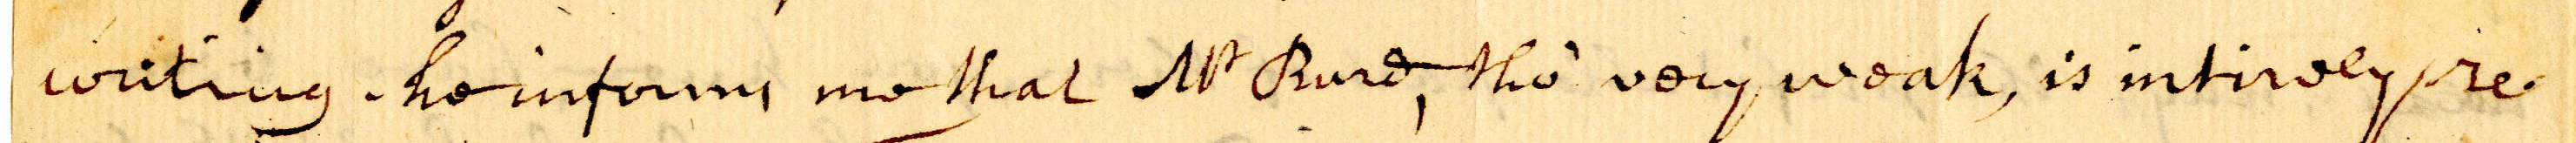writing- he informs me that M^r Burd, tho' very weak, is intirely re-
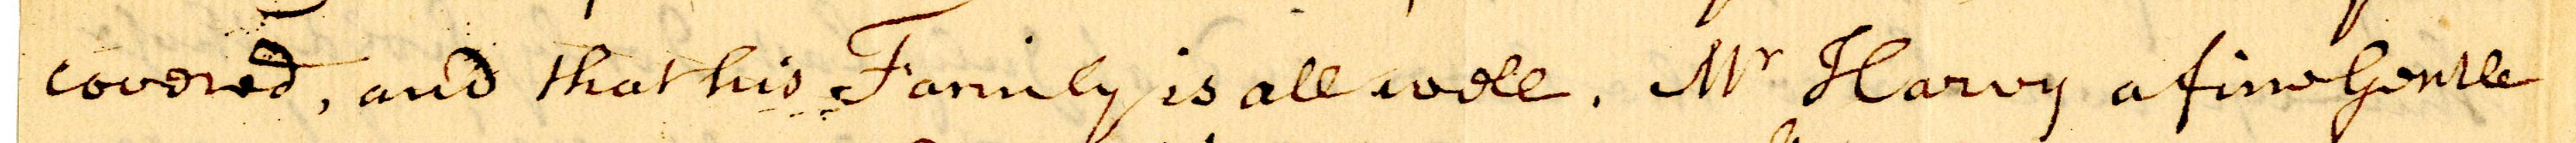covered, and that his Family is all well. M^r Harvy a fine Gentle
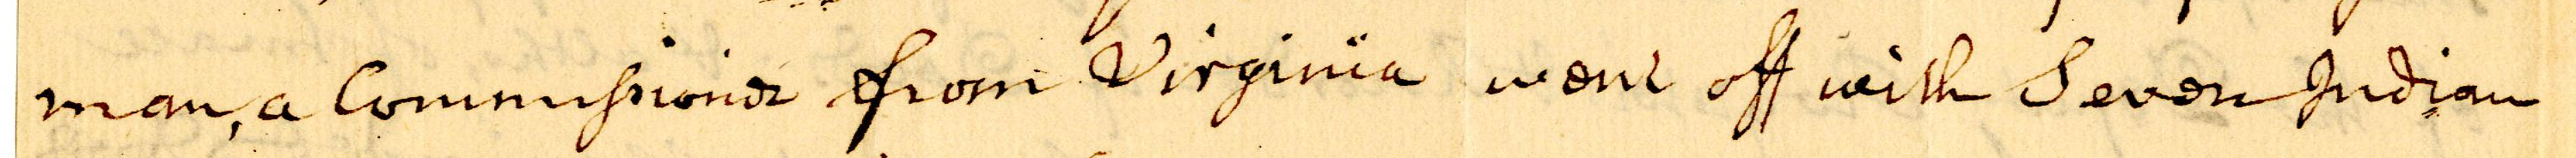man, a Commissioner from Virginia went off with Seven Indian
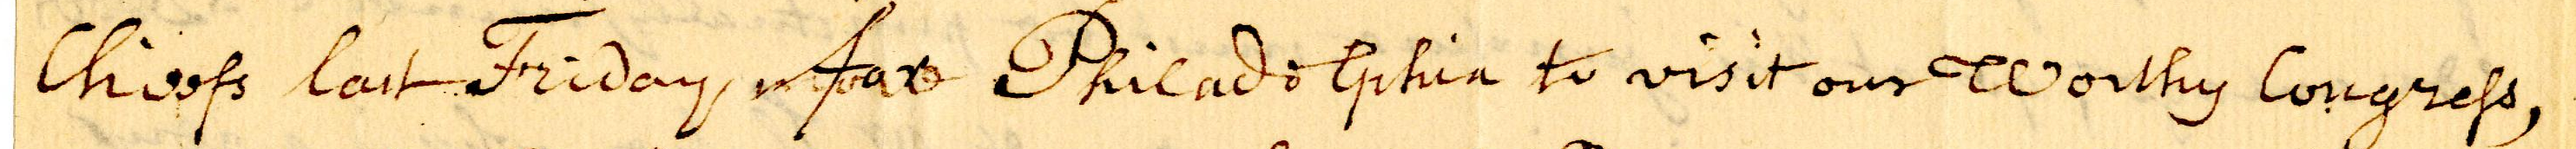Chiefs last Friday for Philadelphia to visit our Worthy Congress,
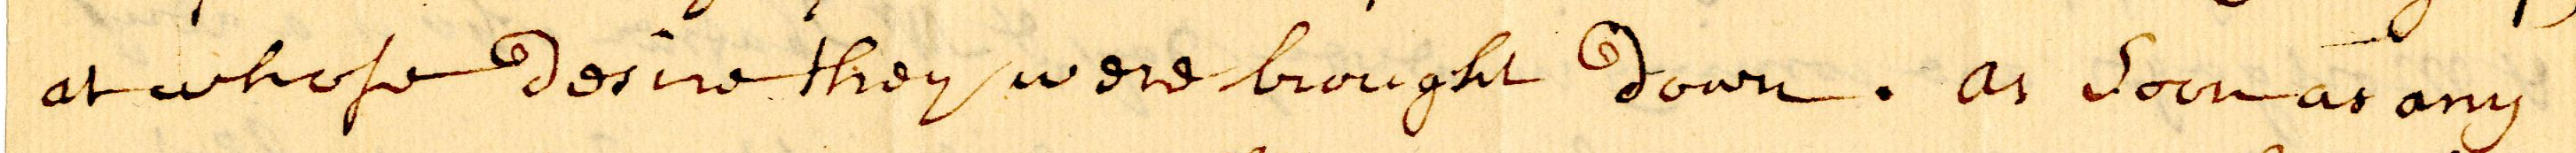at whose desire they were brought down. As Soon as any
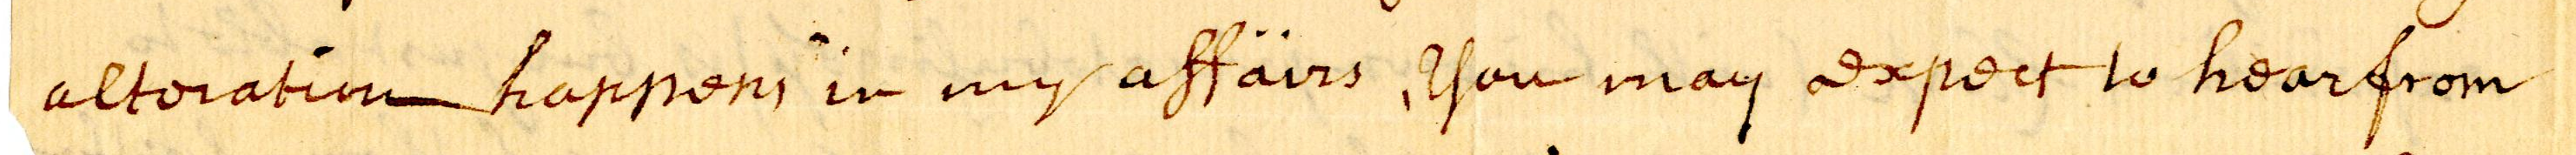alteration happens in my affairs, You may expect to hear from
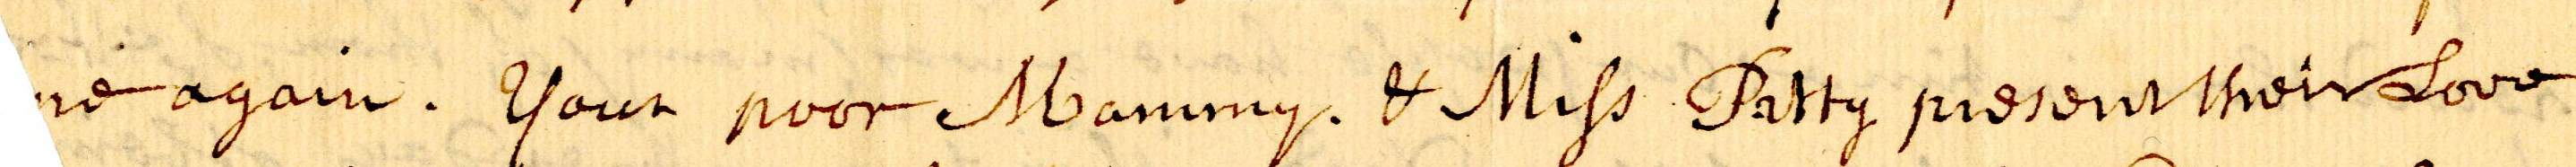me again. Your poor Mammy. & Miss Patty present their Love
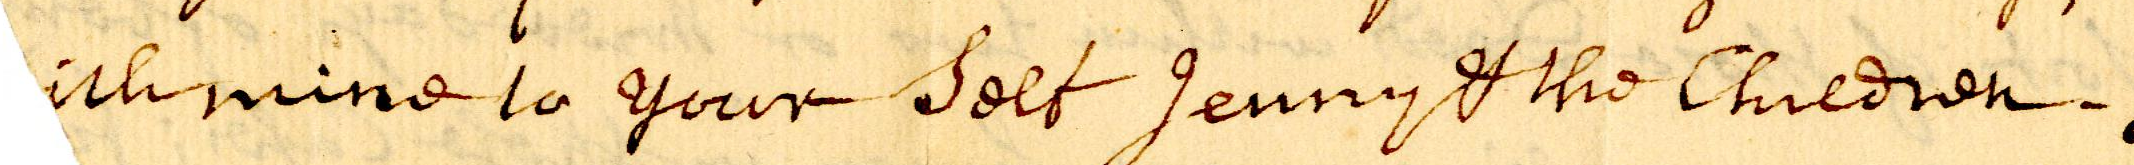ith mine to Your Self Jenny & the Children.
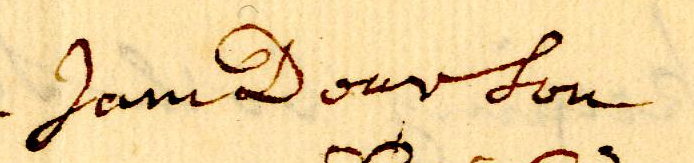I am Dear Son
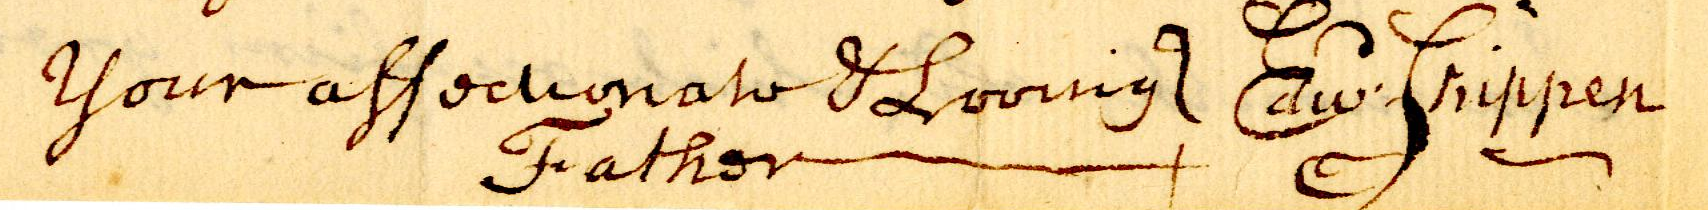Your affectionate & Loving Edw. Shippen
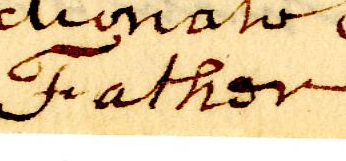Father
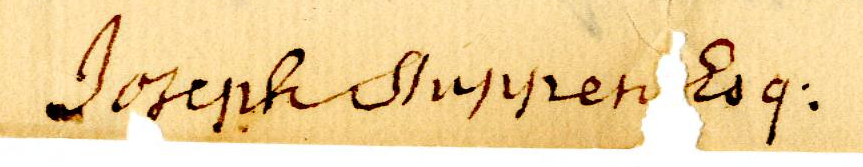Joseph Shippen Esq:
